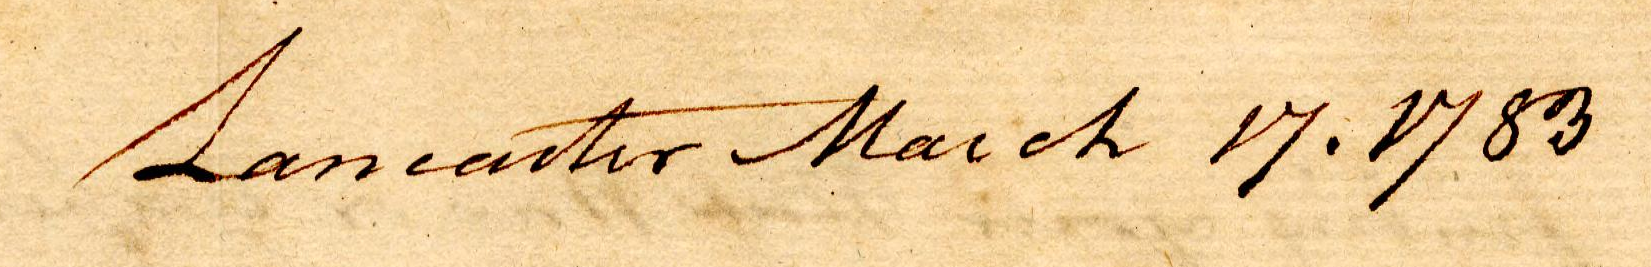Lancaster March 17. 1783
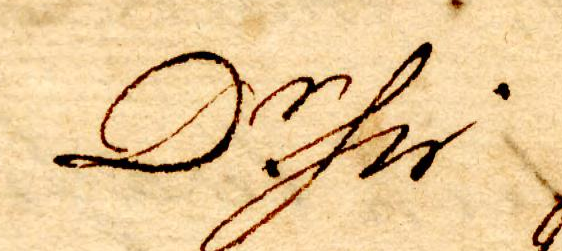D^r Sir
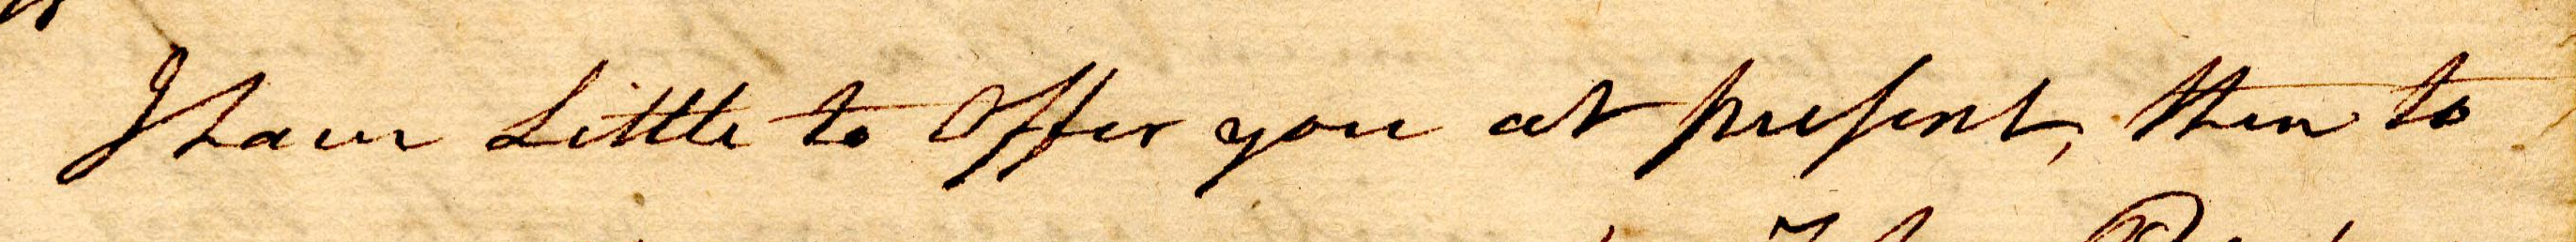I have Little to Offer you at present, then to
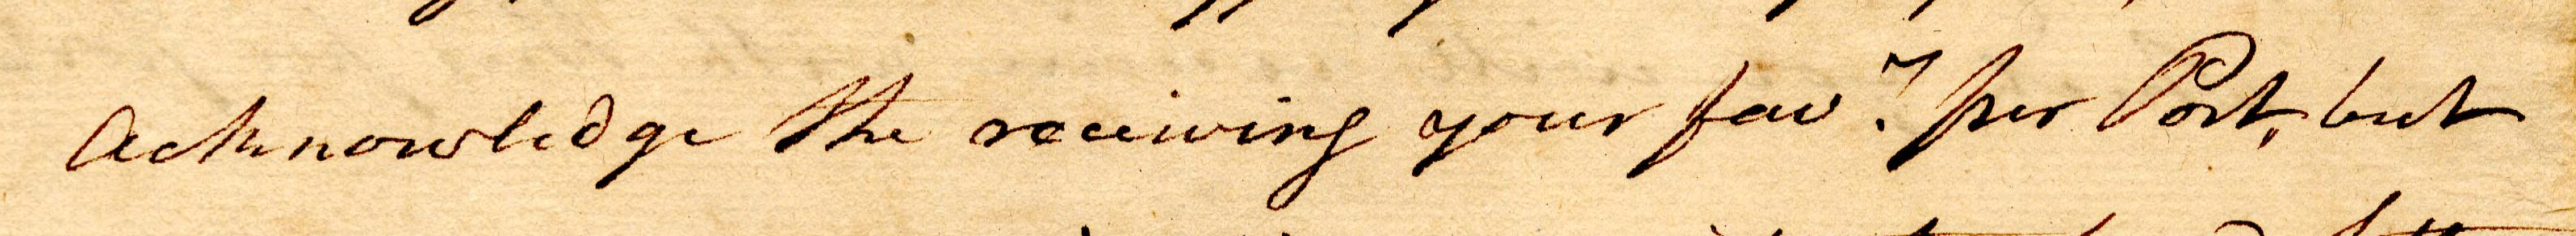Acknowledge the receiving your fav^r. per Post, but
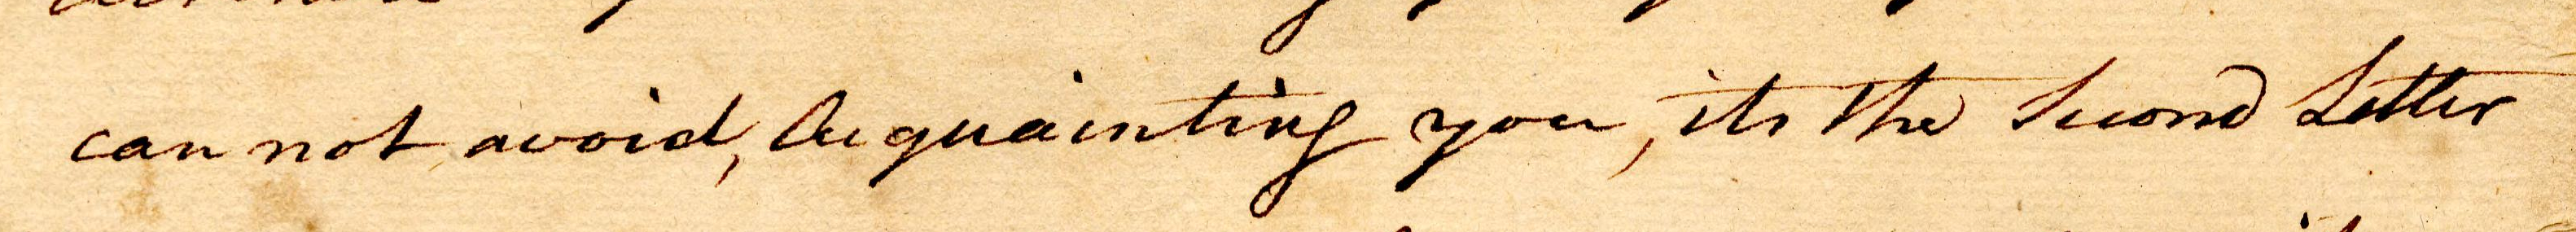can not avoid, Acquainting you, its the Second Letter
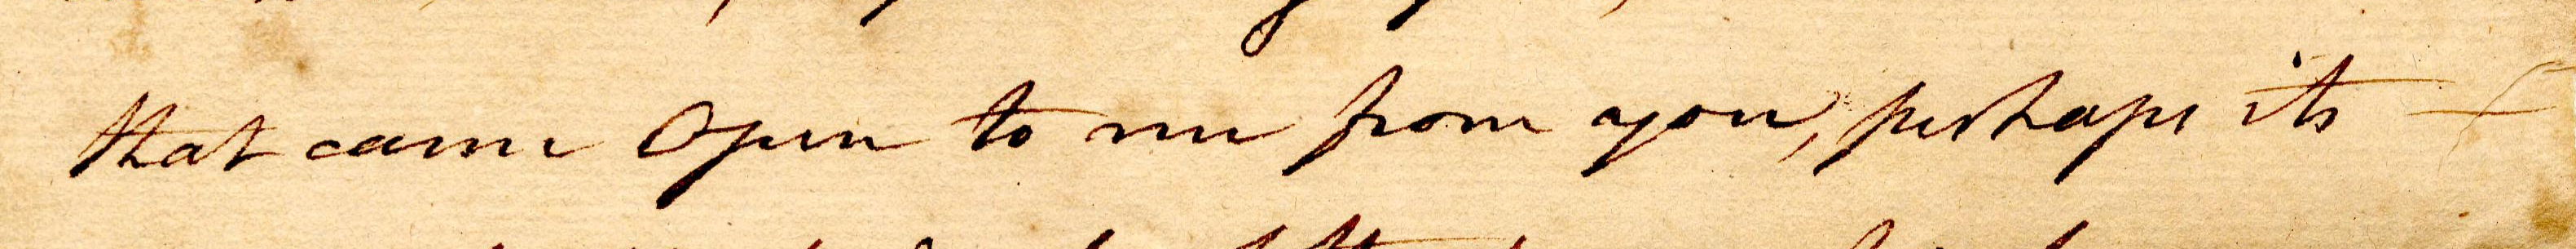that came Open to me from you, perhaps its-
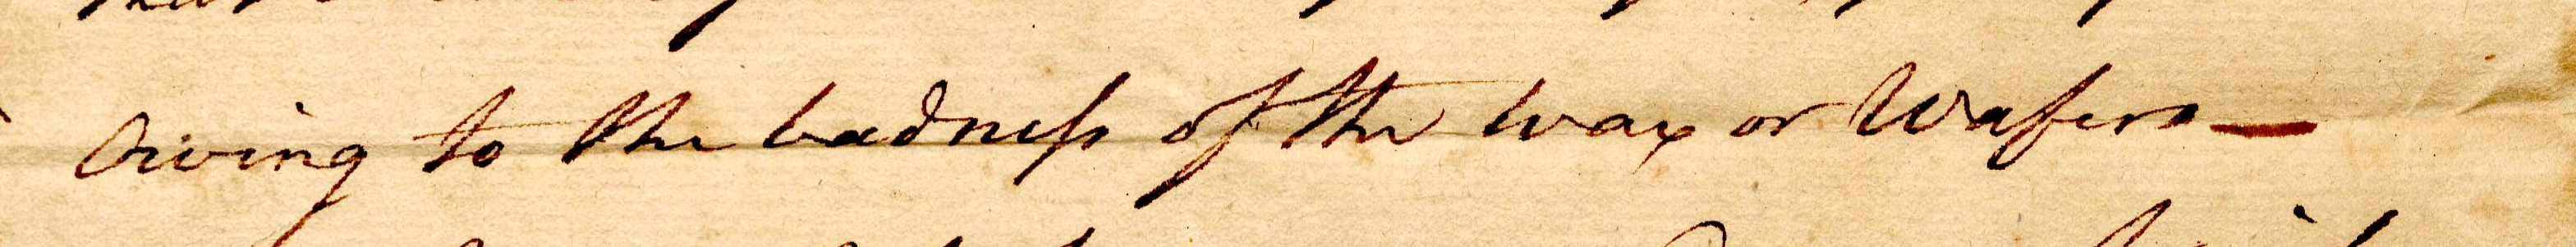owing to the badness of the wax or Waters.-
